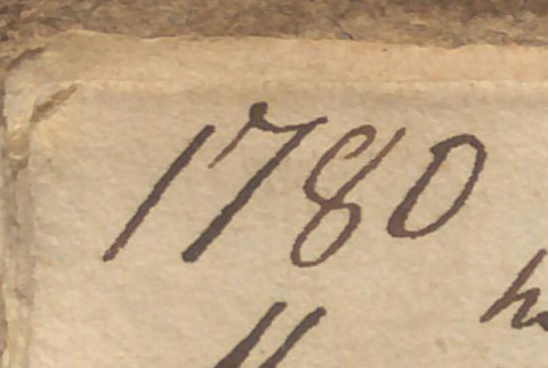1780
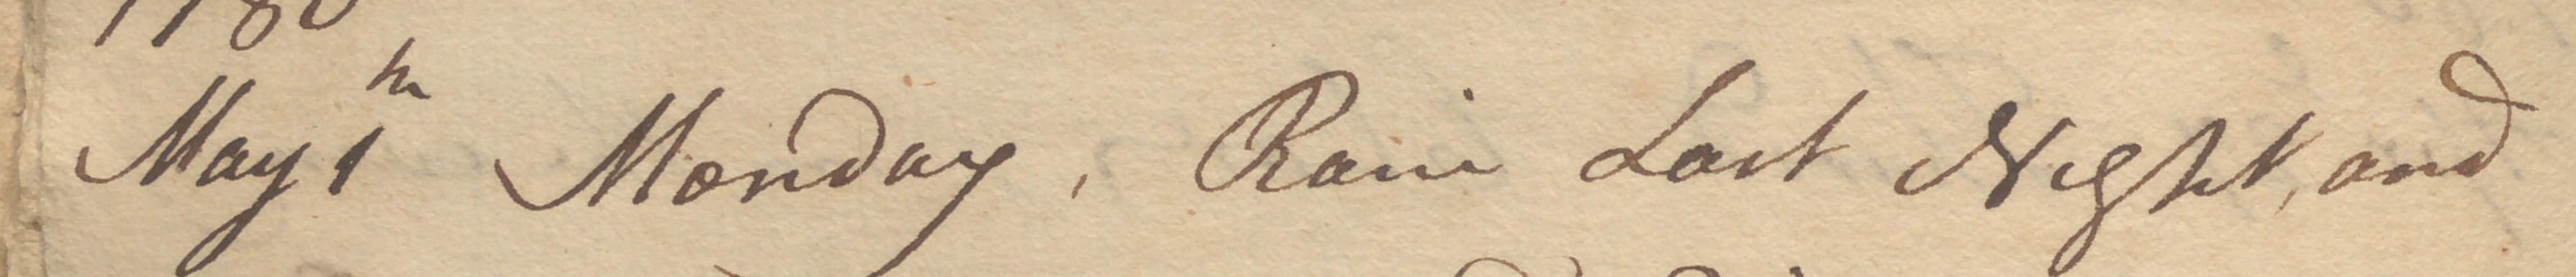May 1^th Monday. Rain Last Night, and
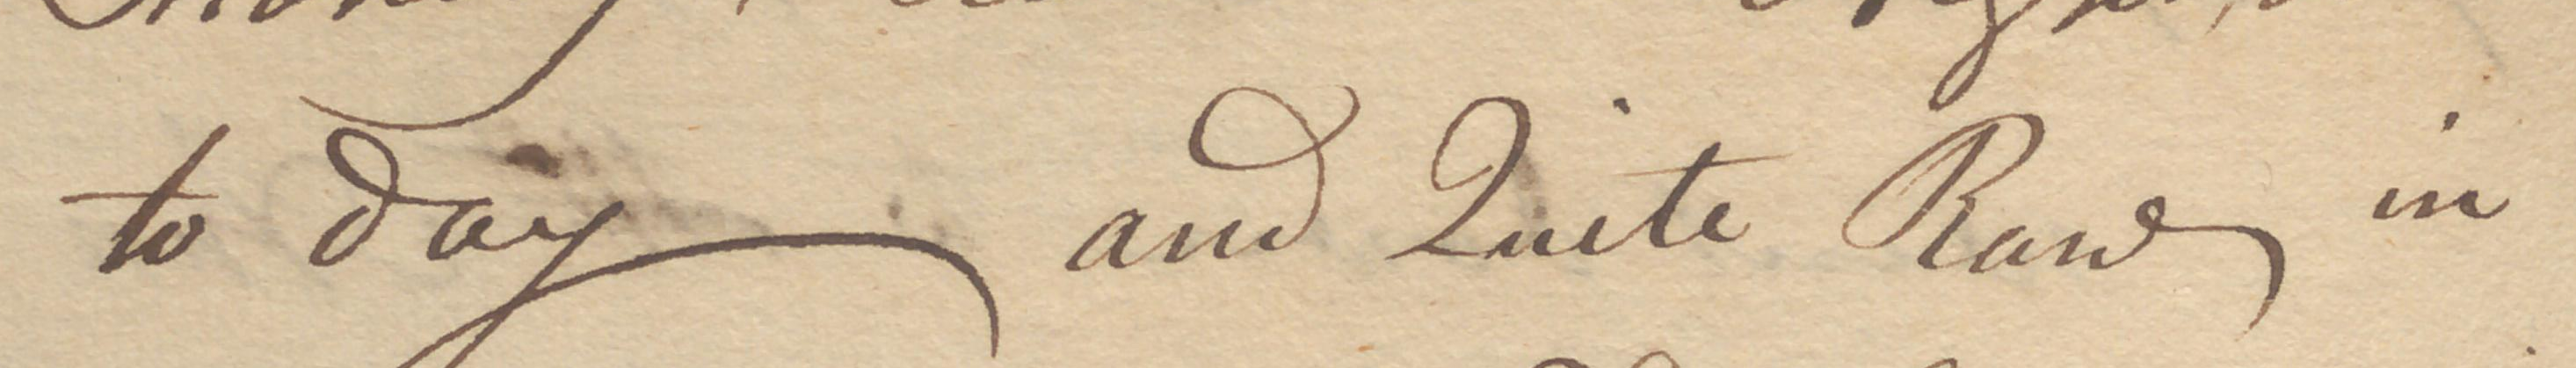to day and Quite Raw in
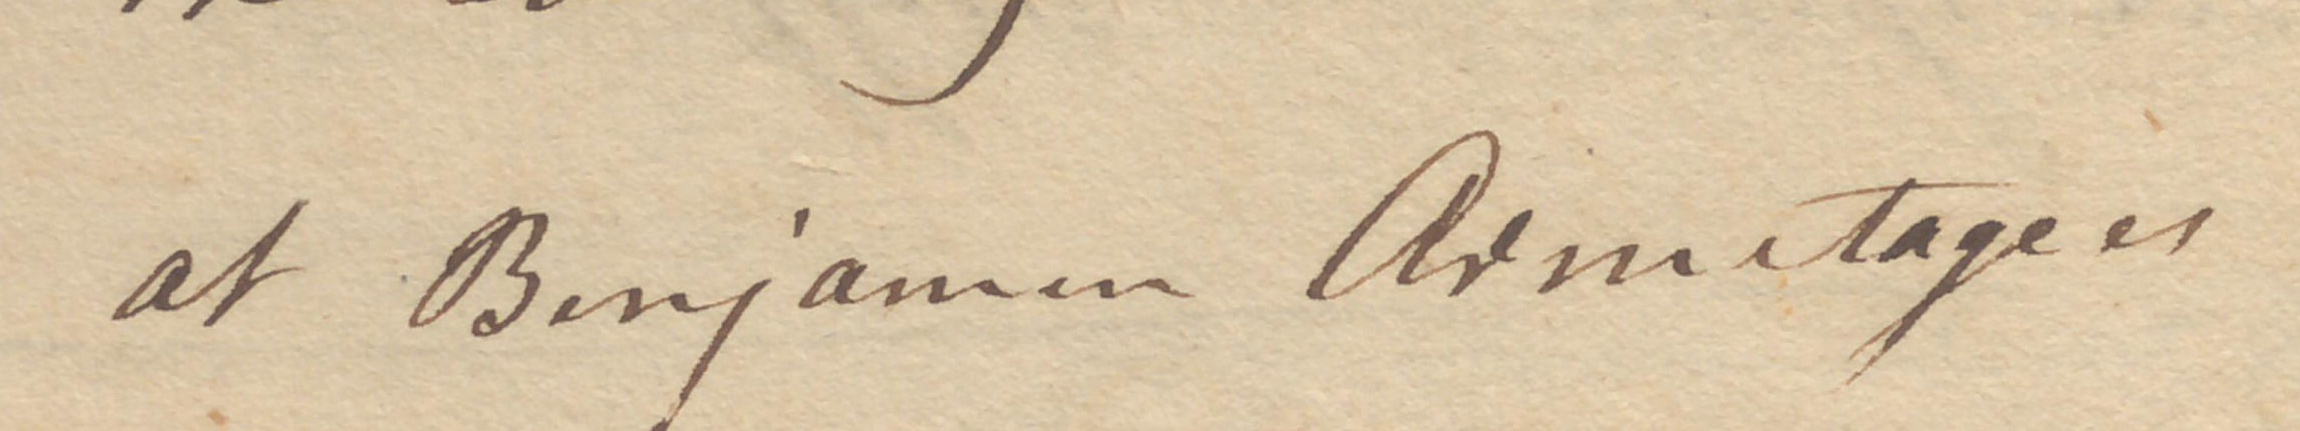at Benjamin Armitagees
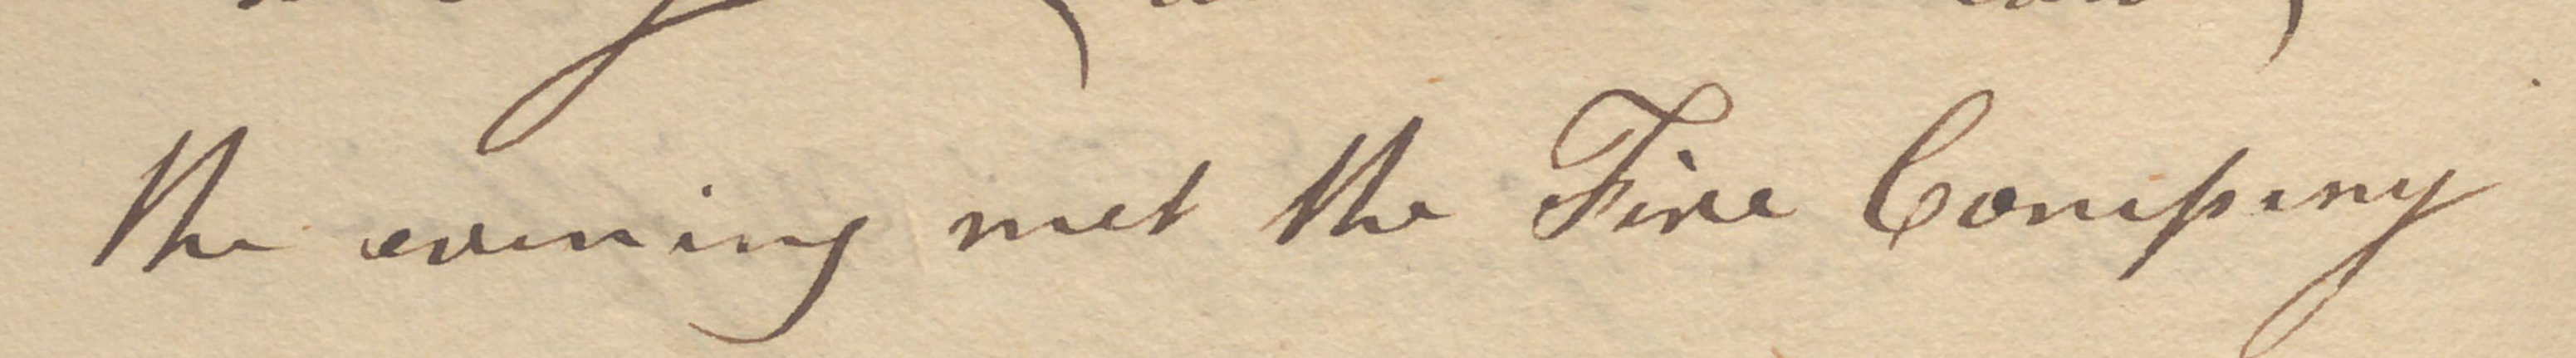the evening met the Fire Compiny
